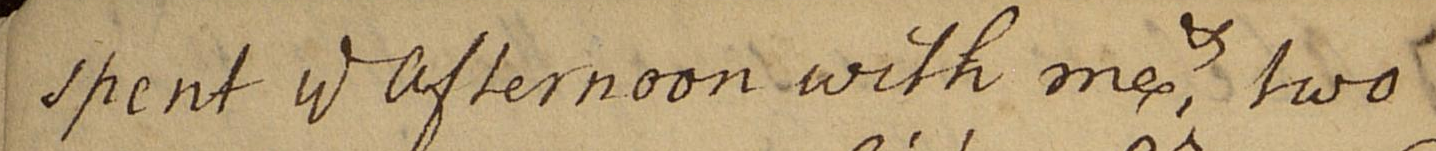spent y^e Afternoon with me, ^& two
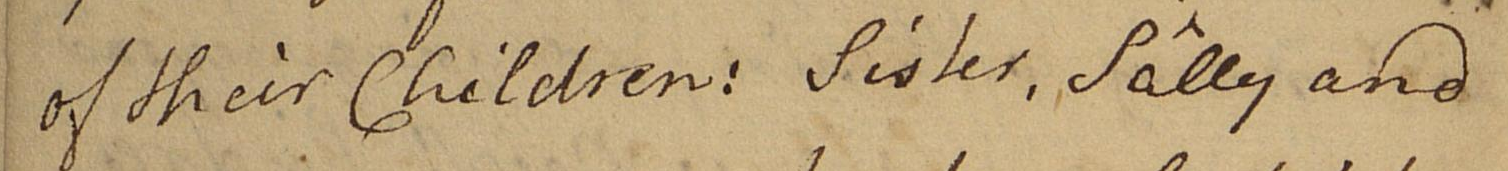of their Children: Sister, Sally and
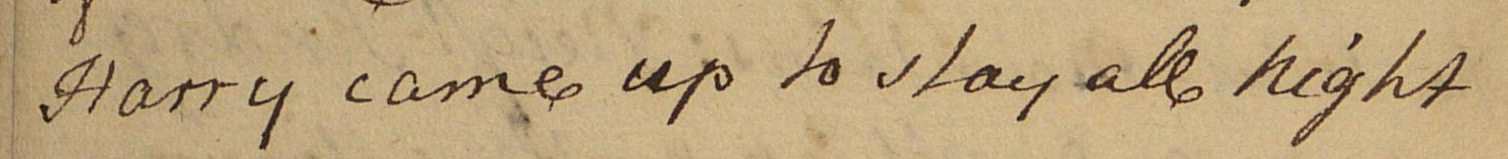Harry came up to stay all night
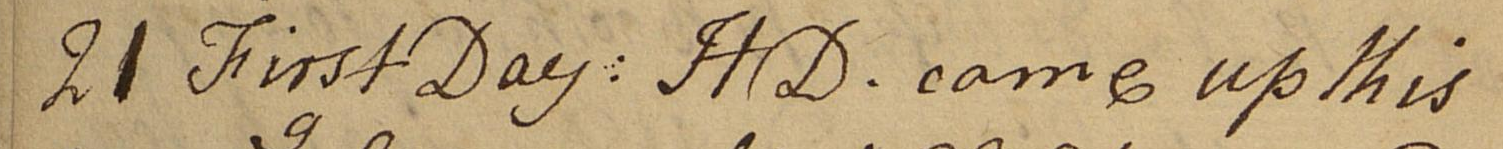21 First Day: H D. came up this
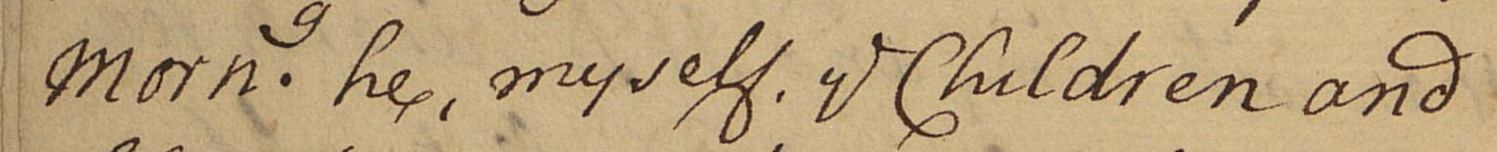Morn^g he, myself, y^e Children and
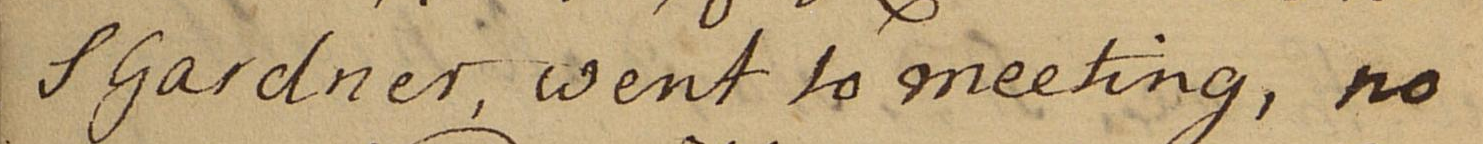S Gardner, went to meeting, no
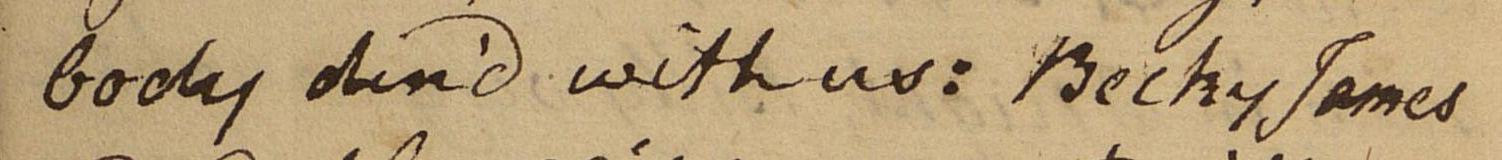body din'd with us: Becky James
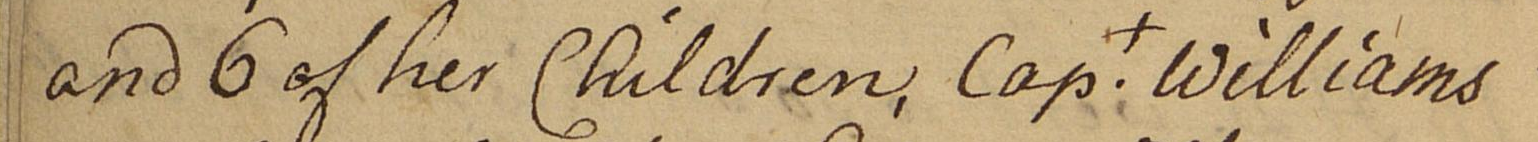and 6 of her Children, Cap^t Williams
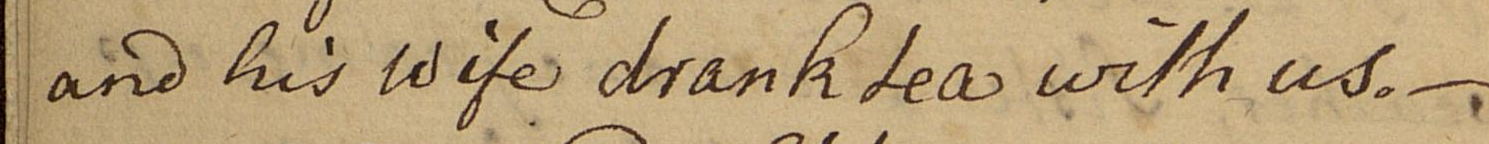and his Wife drank tea with us.-
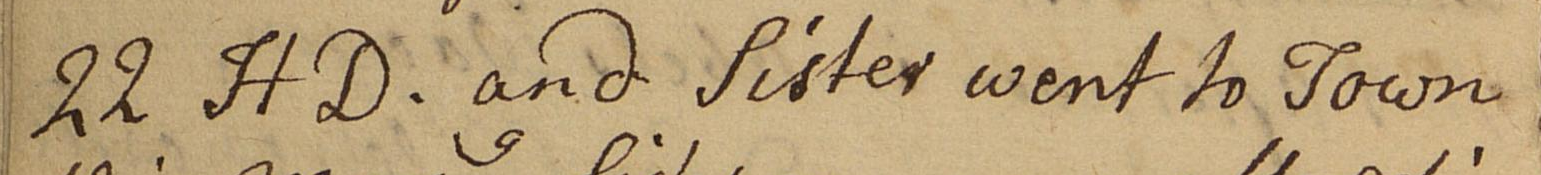22 HD. and Sister went to Town
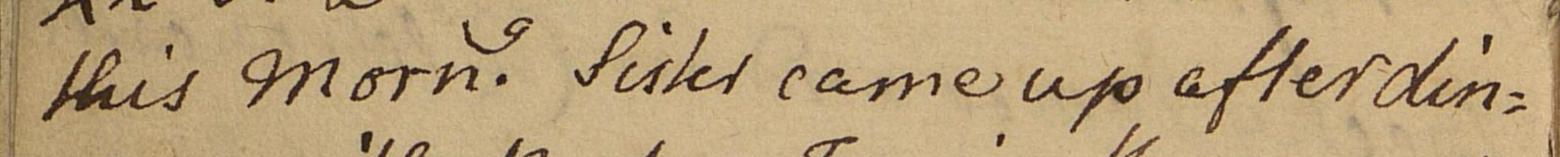this Morn^g Sister came up after din-
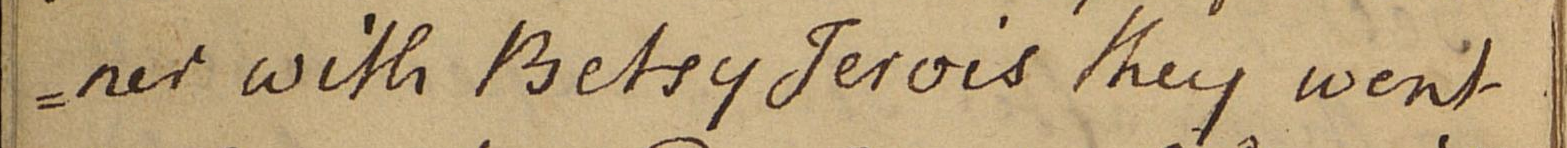-ner with Betsy Jervis they went
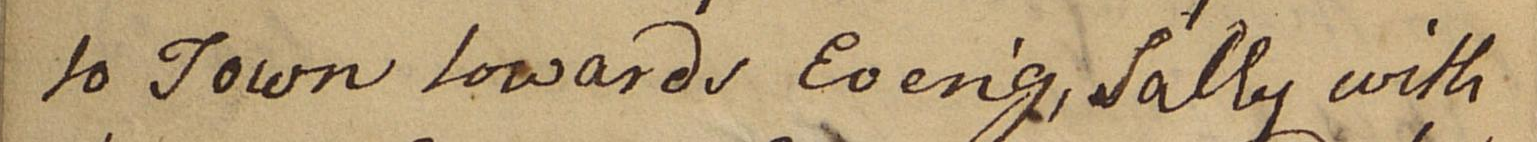to Town towards Even'g, Sally with
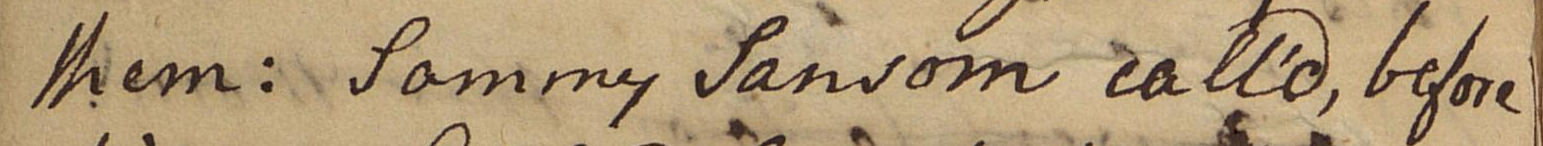them: Sammy Sansom call'd, before
